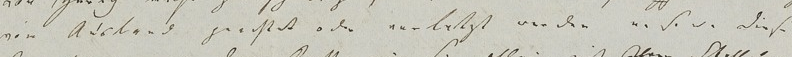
vom Ausland geachtet oder verletzt werden u. s. w. Diese
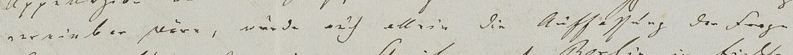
vereinbar wäre, würde auch allein die Auffassung der Frage
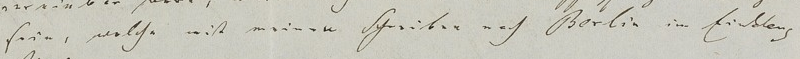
sein, welche mit meinen Schreiben nach Berlin im Einklang
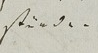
stünde.
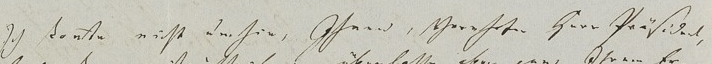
Ich konnte nicht umhin, Ihnen, Verehrter Herr Präsident,
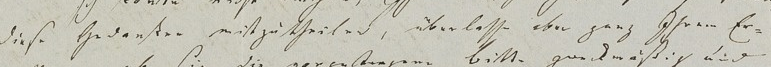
diese Gedanken mitzutheilen, überlasse aber ganz Ihrem Er-
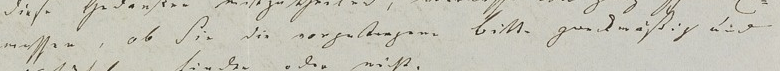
messen, ob Sie die vorgetragene Bitte zweckmäßig und
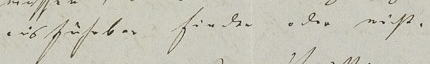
ausführbar finden oder nicht.
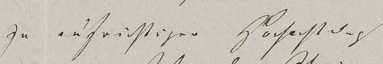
In aufrichtiger Hochachtung
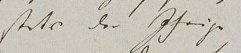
stets der Ihrige
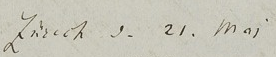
Zürich d. 21. Mai
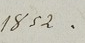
1852.
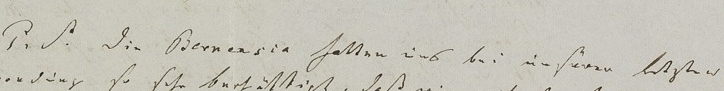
P. S. Die Bernensia hatten uns bei unserer letzten
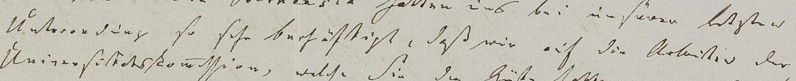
Unterredung so sehr beschäftigt, daß wir auf die Arbeiten der
